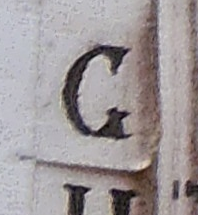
G
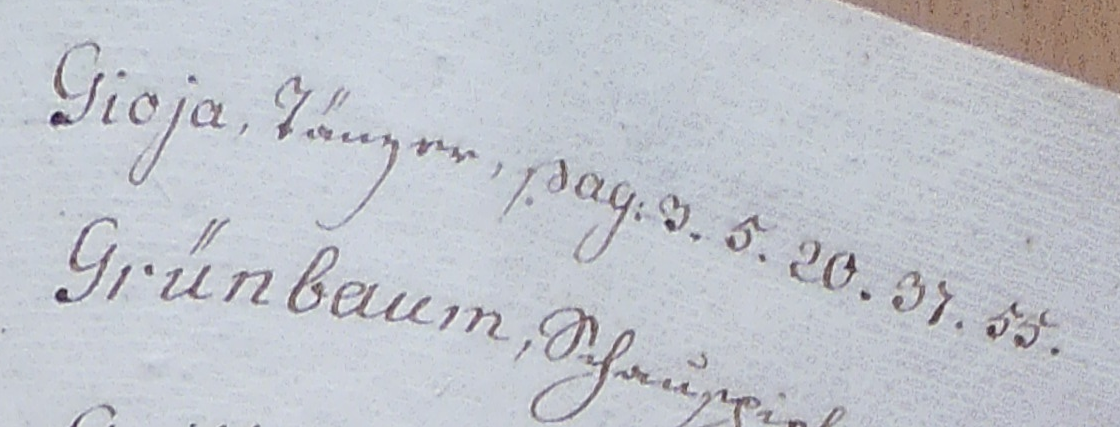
Gioja, Tänzer, pag. 3. 5. 20. 37. 55.
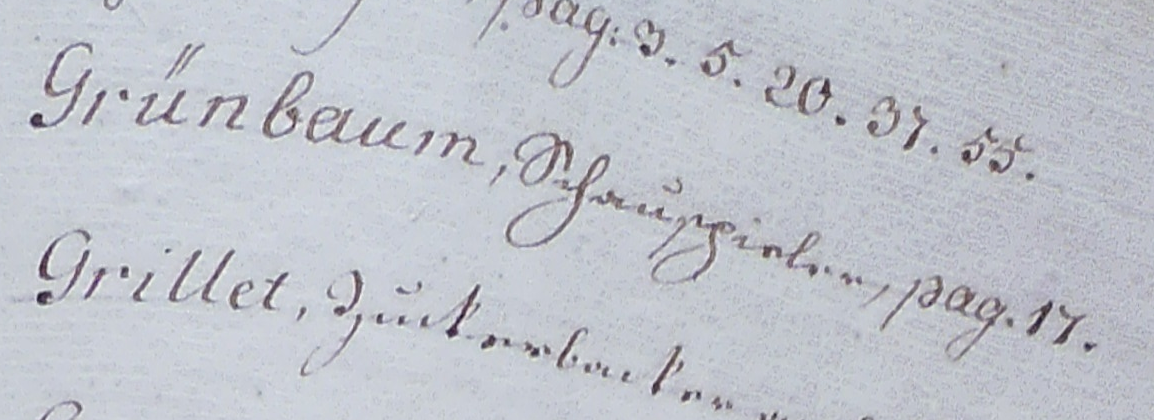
Grünbaum, Schauspieler, pag. 17.
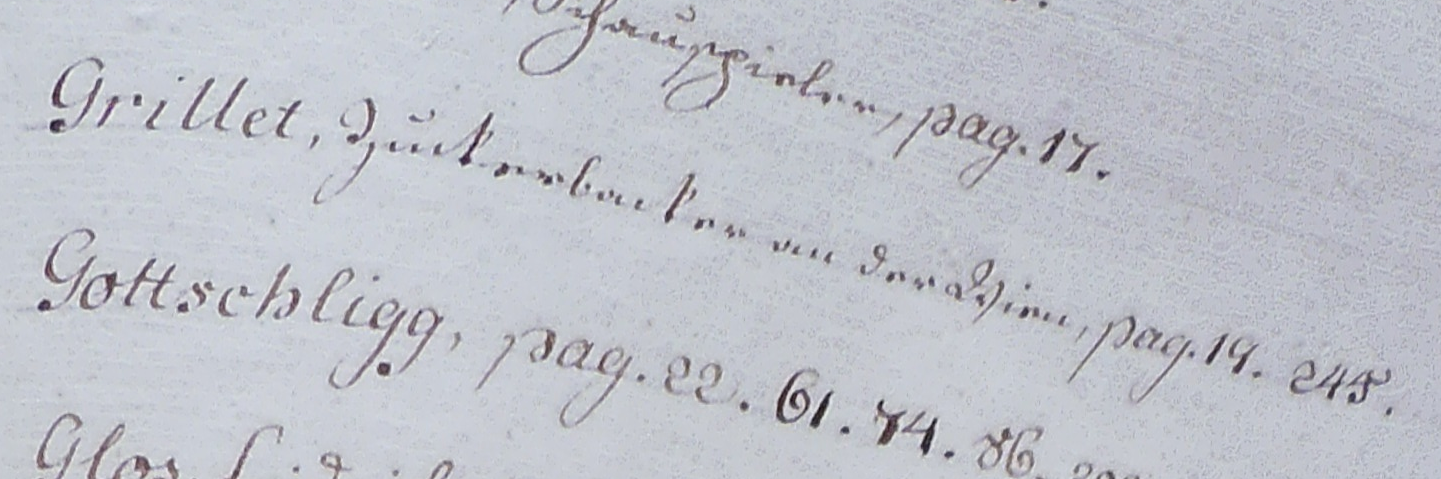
Grillet, Zuckerbacker an der Wien, pag. 19. 245.
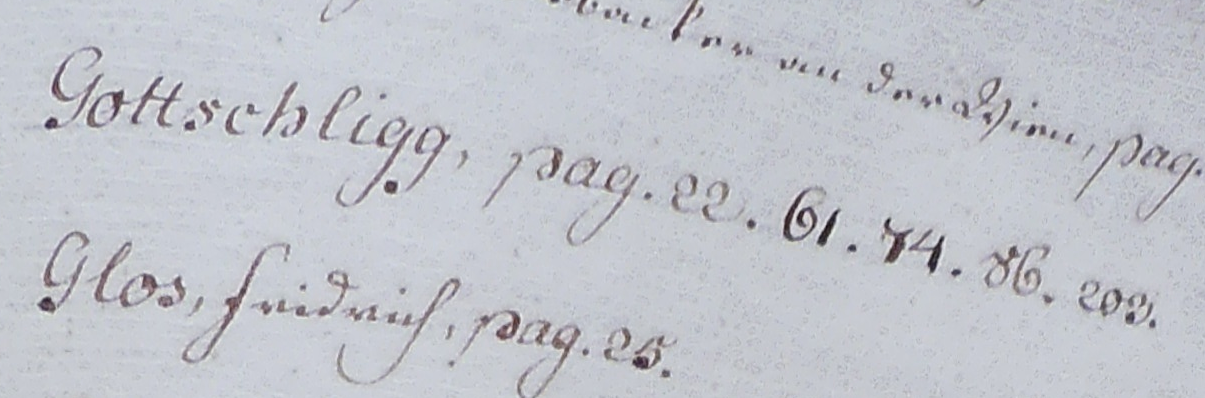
Gottschligg, pag. 22. 61. 74. 86. 203.
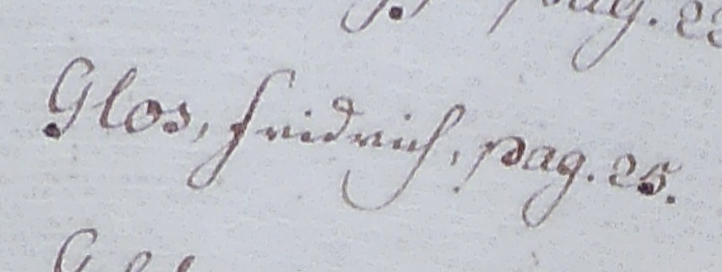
Glos, Fridrich, pag. 25.
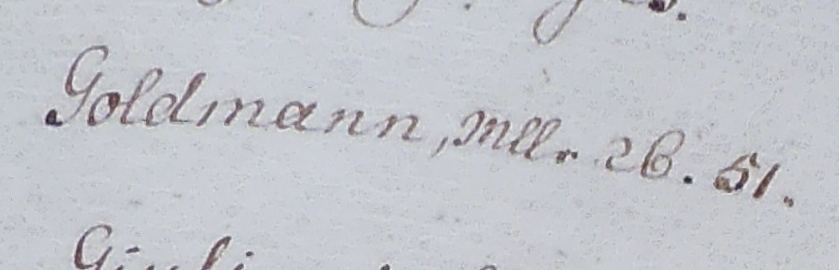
Goldmann, Mlle 26. 51.
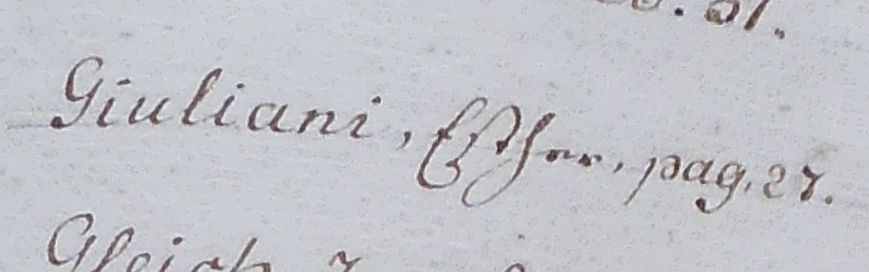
Giuliani, Esther, pag. 27.
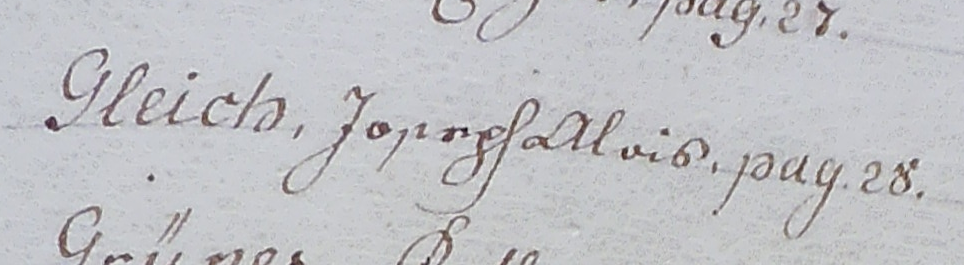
Gleich, Joseph Alois, pag. 28.
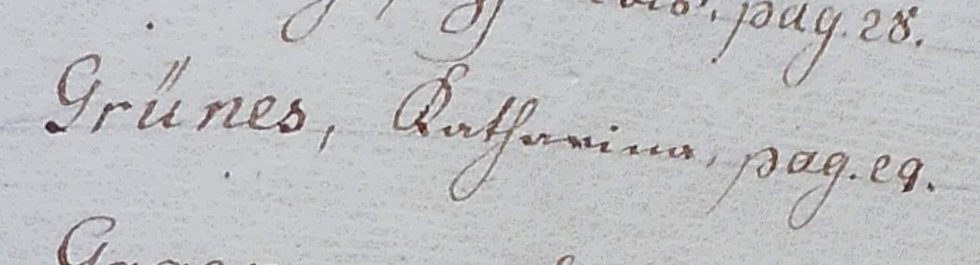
Grünes, Katharina, pag. 29.
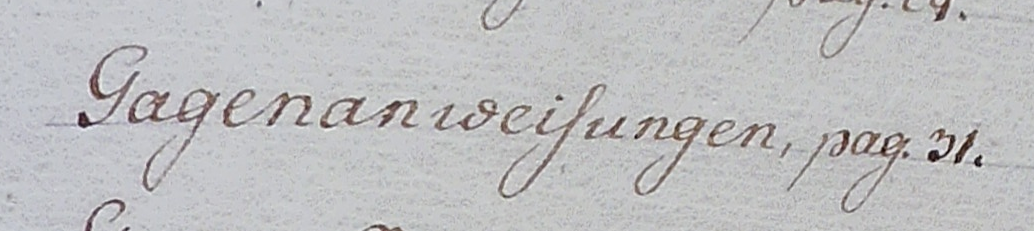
Gagenanweisungen, pag. 31.
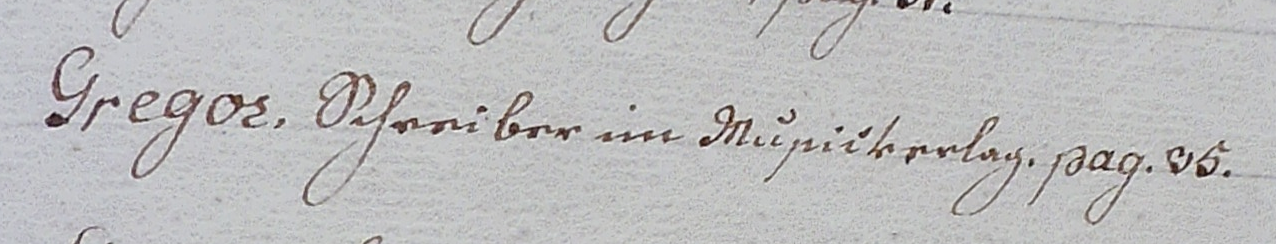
Gregor, Schreiber im Musicverlag. pag. 35.
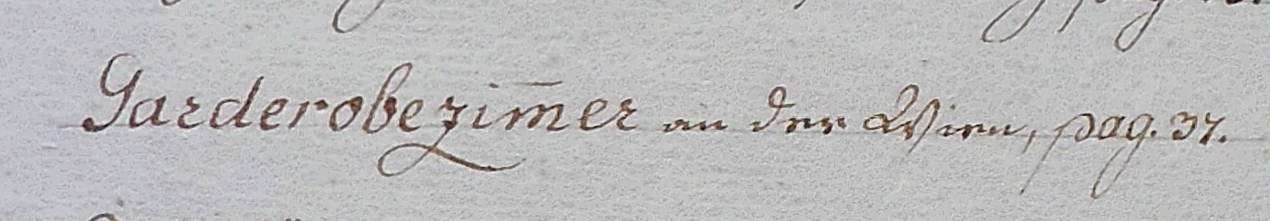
Garderobezim̅er an der Wien, pag. 37.
